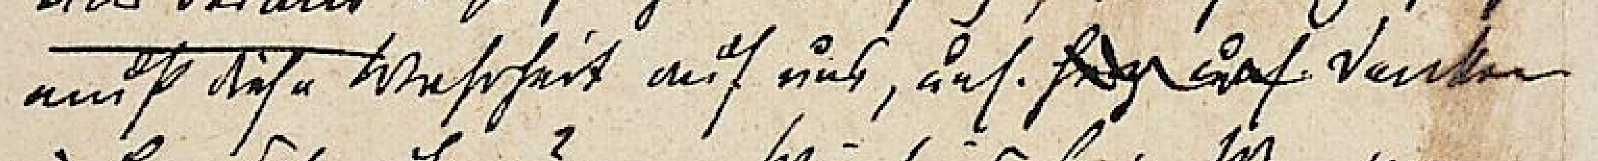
muß diese Wahrheit auf uns, uns. frag. uns. Denken
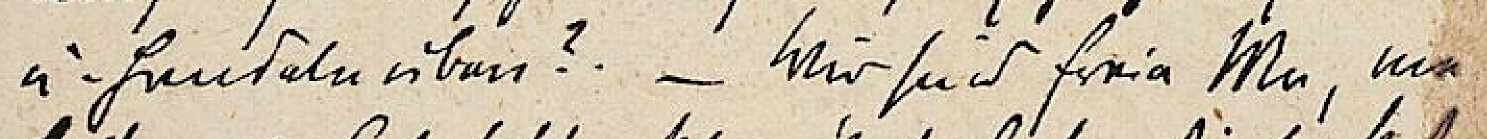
u. Handeln üben? _ Wir sind freie Mn, wir
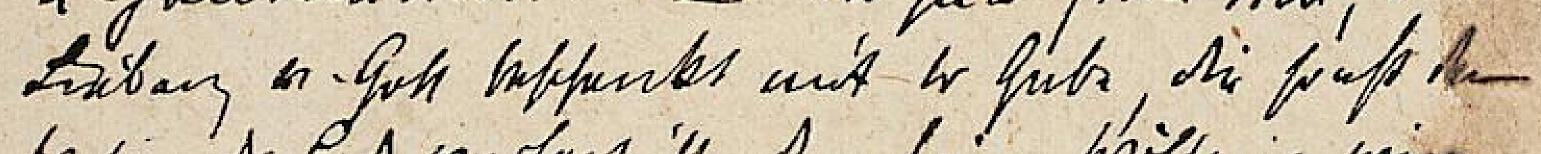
Lieben, v. Gott beschenkt mit 1r Gabe, die sonst knm
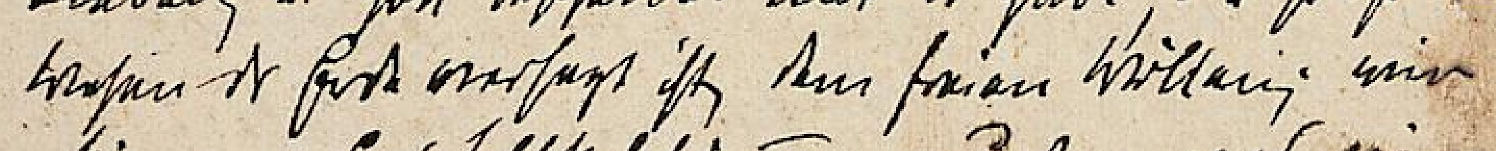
Wesen dr Erde versagt ist, dem freien Willen; wir
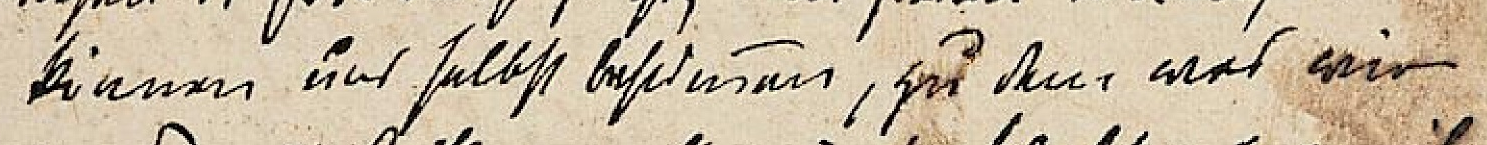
können uns selbst bestimen, zu dem was wir
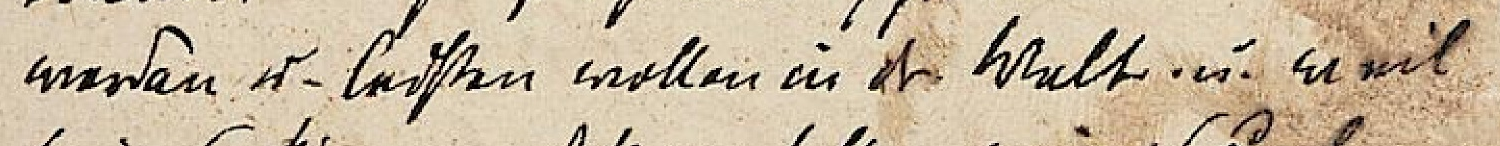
werden u. leisten wollen in dr. Welt u. weil
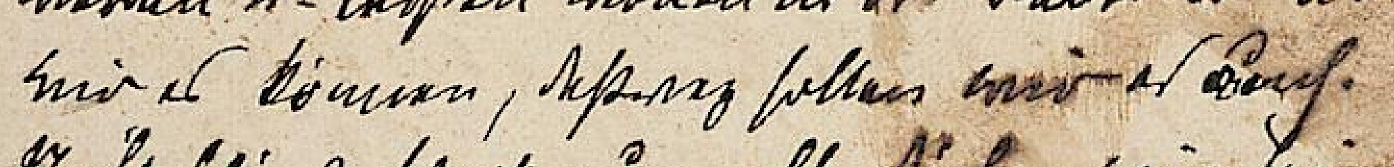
wir es können, deßweg. sollten wir es auch.
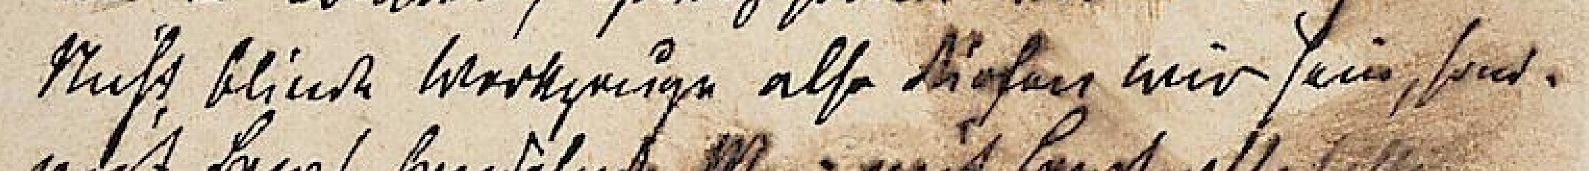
Nicht blinde Werkzeug also dürfen wir sein, sond.
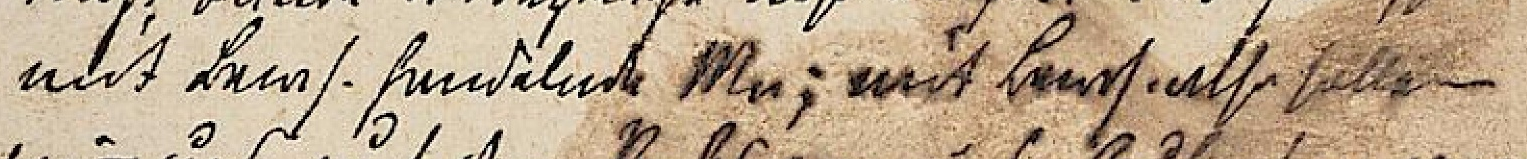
mit Bews. handelnde Mn; mit Bews. also sollen
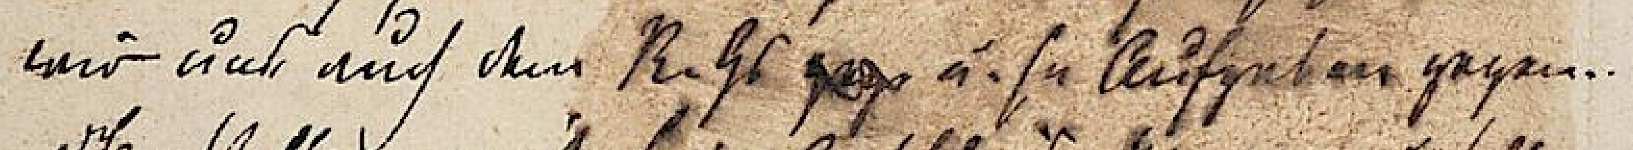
wir uns auch dem R . Gs. geg. u. sn Aufgaben gegen¬
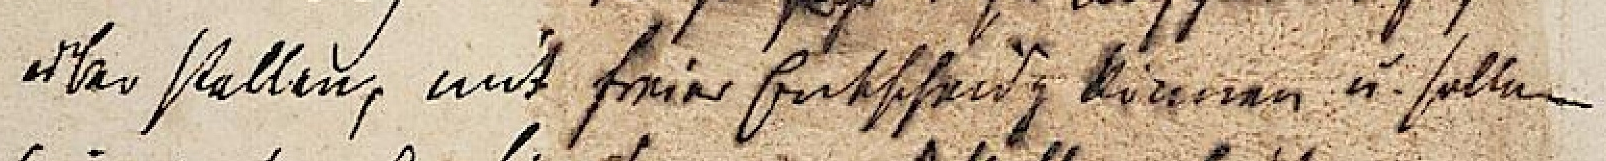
über stellen, mit freier Entscheidg können u. sollen
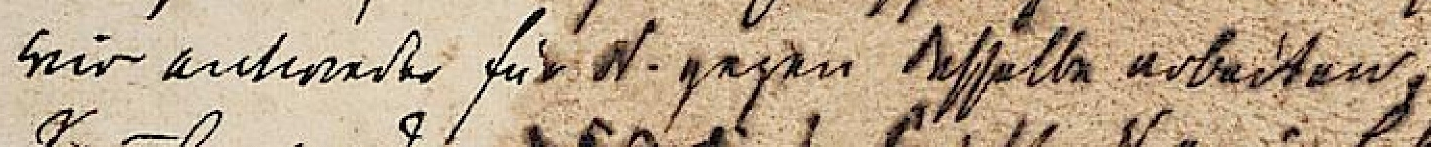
wir entweder für od. gegen dasselbe arbeiten.
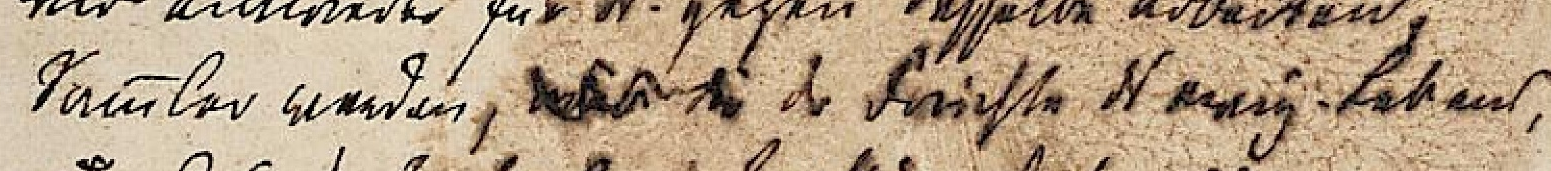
Samler werden, oder die dr. Früchte des weig. Lebens,
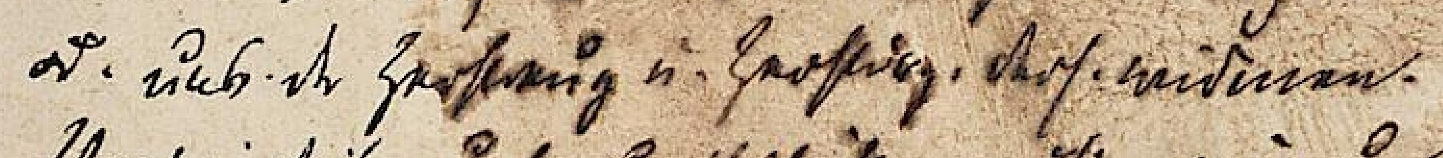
od. uns dr Zerstreug u. Zerstörg. ders. widmen.
